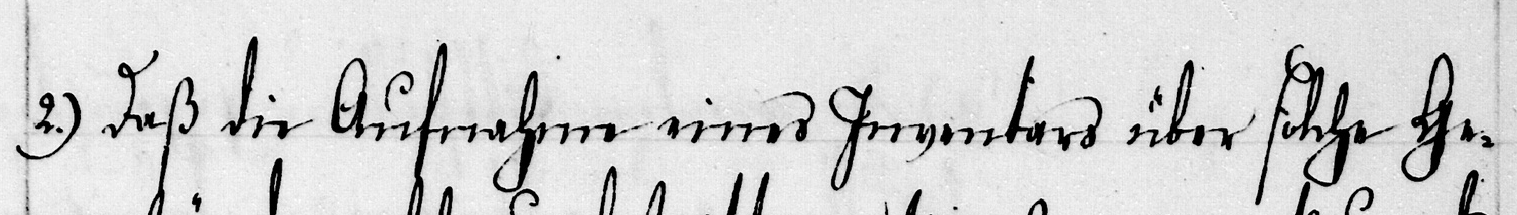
2.) Daß die Aufnahme eines Inventars über solche Ge¬
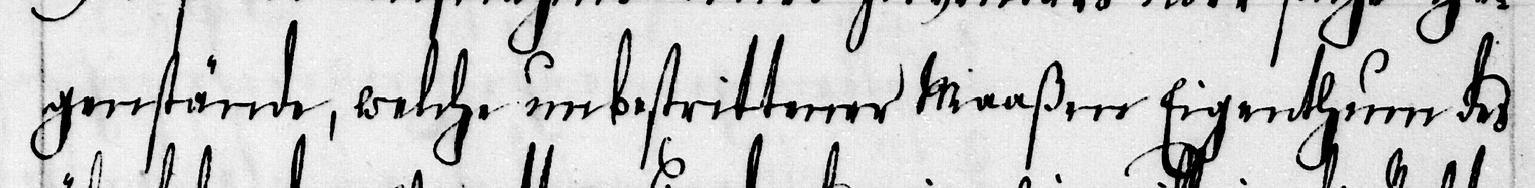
genstände, welche unbestrittener Maaßen Eigenthum des
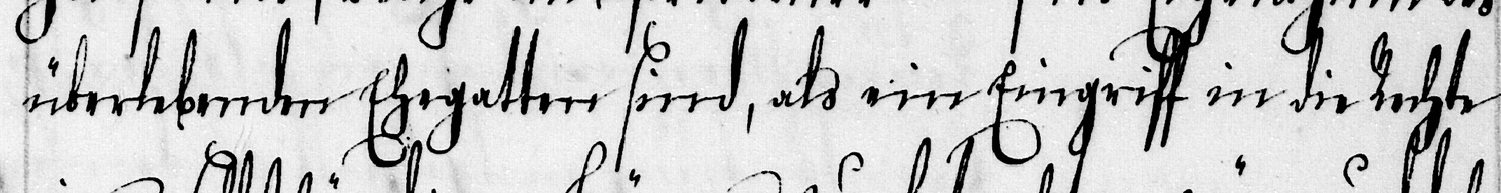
überlebenden Ehegatten sind, als ein Eingriff in die Rechte
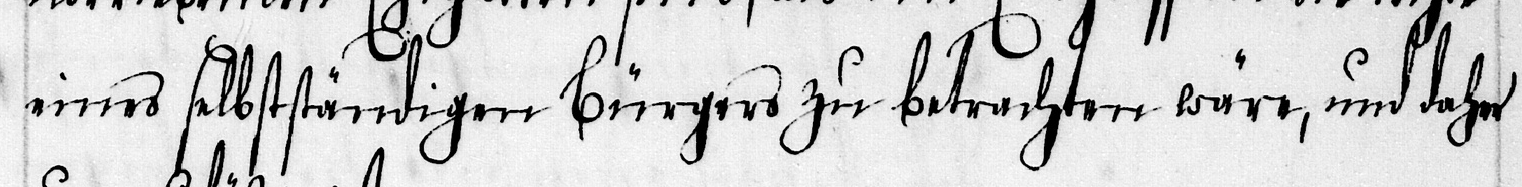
eines selbstständigen Bürgers zu betrachten wäre, und daher
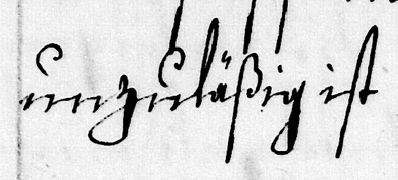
unzuläßig ist
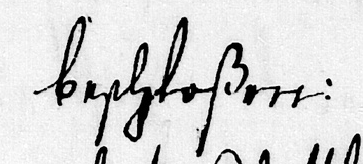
beschloßen:
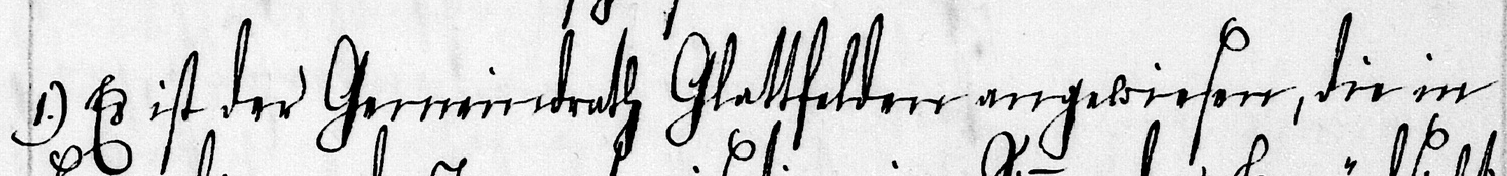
1.) Es ist der Gemeindrath Glattfelden angewiesen, die in
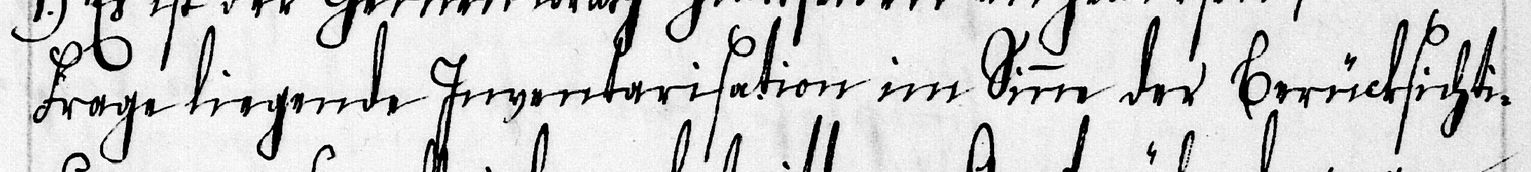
Frage liegende Inventarisation im Sinne der Berücksichti¬
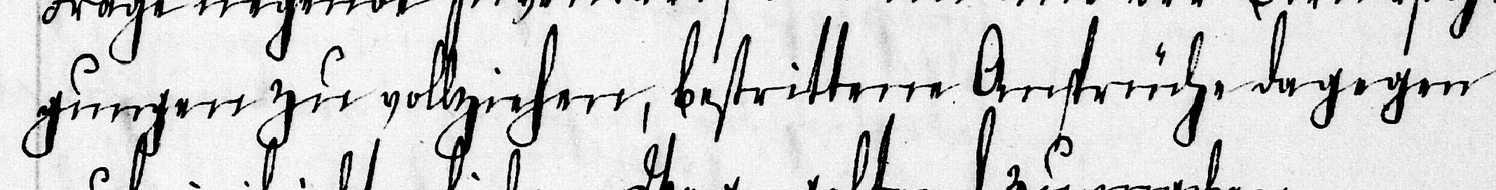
gungen zu vollziehen, bestrittene Ansprüche dagegen
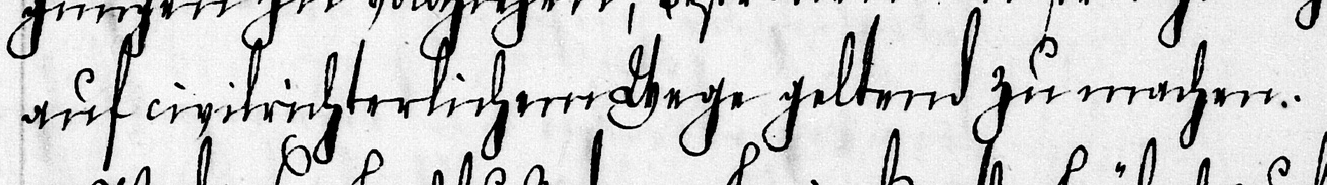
auf civilrichterlichem Wege geltend zu machen.
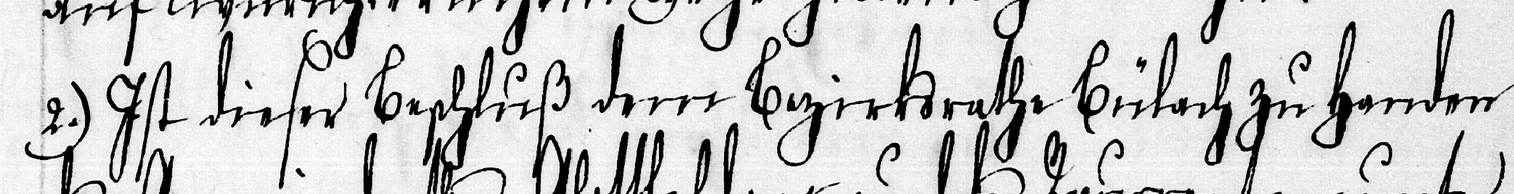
2.) Ist dieser Beschluß dem Bezirksrathe Bülach zu Handen
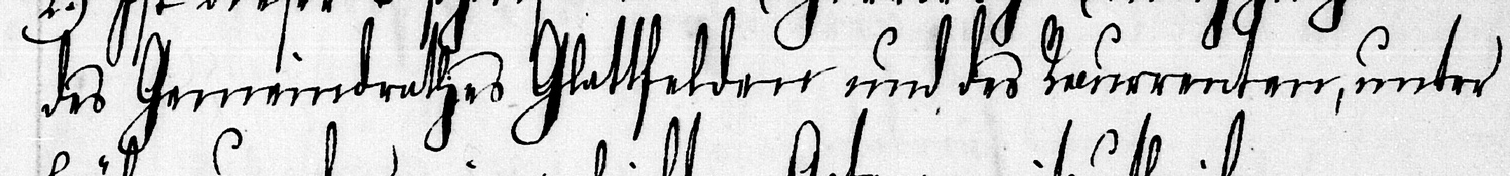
des Gemeindrathes Glattfelden und des Recurrenten, unter
